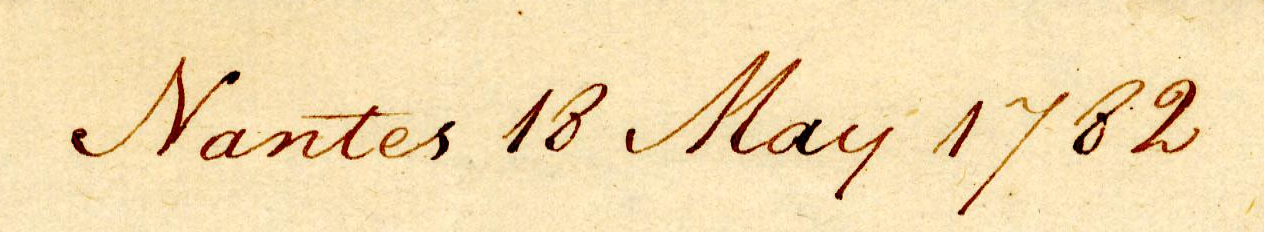Nantes 18 May 1782
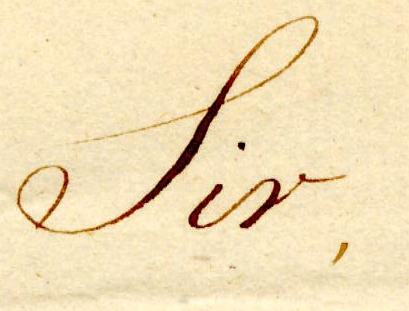Sir,
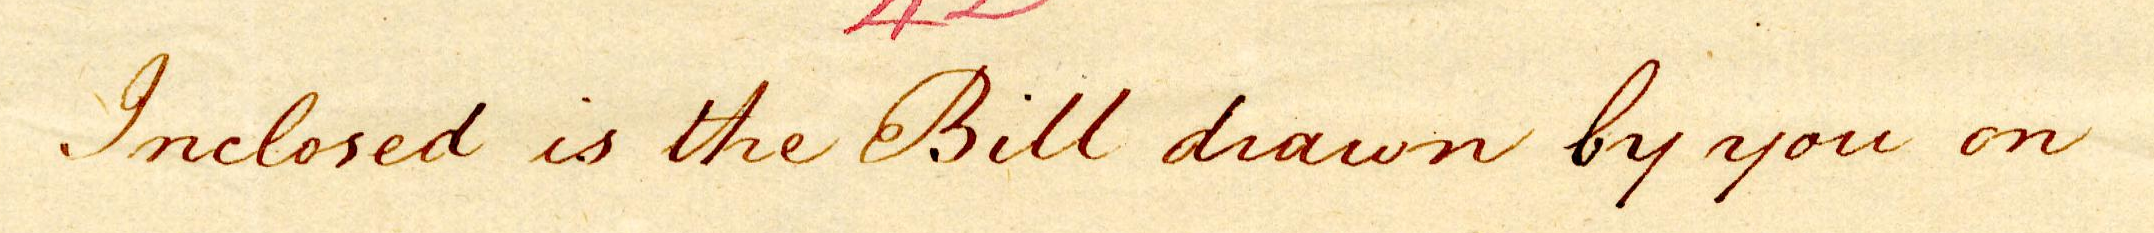Inclosed is the Bill drawn by you on
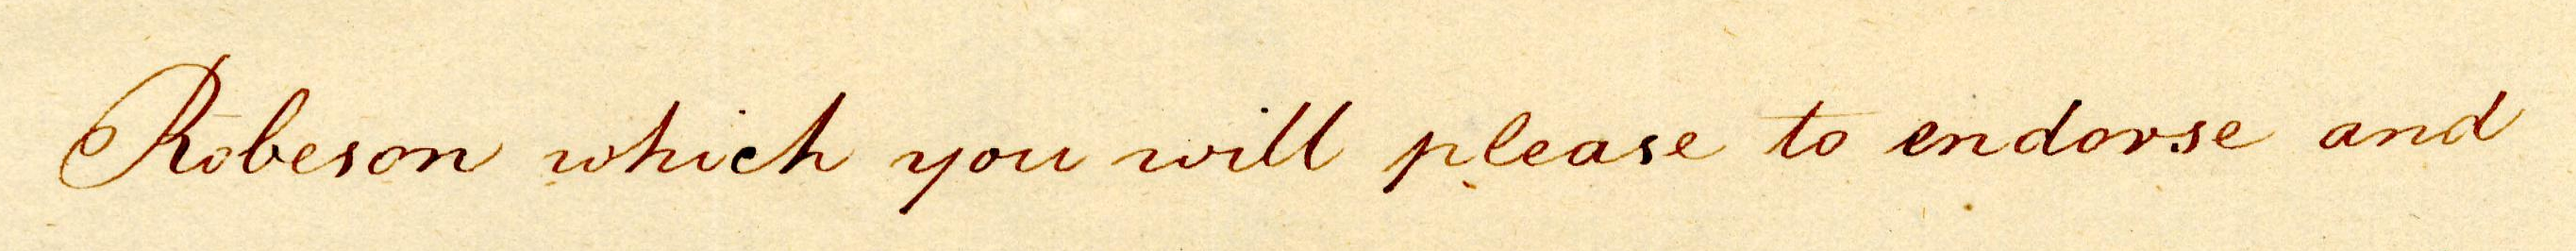Robeson which you will please to endorse and
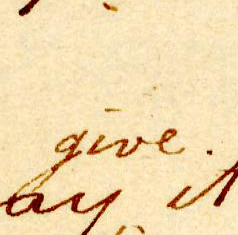give
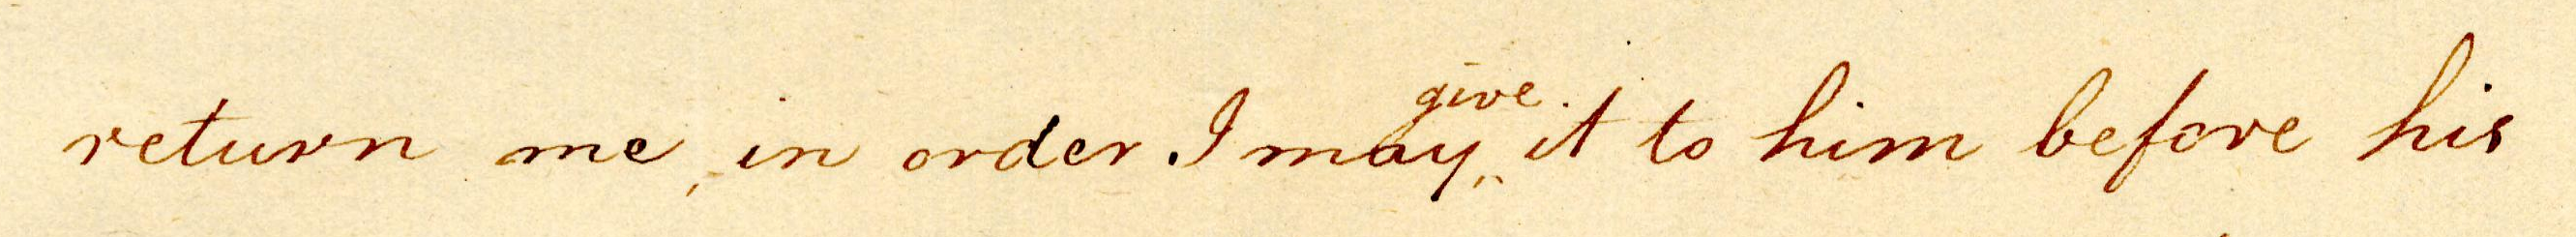return me, in order I may ^ it to him before his
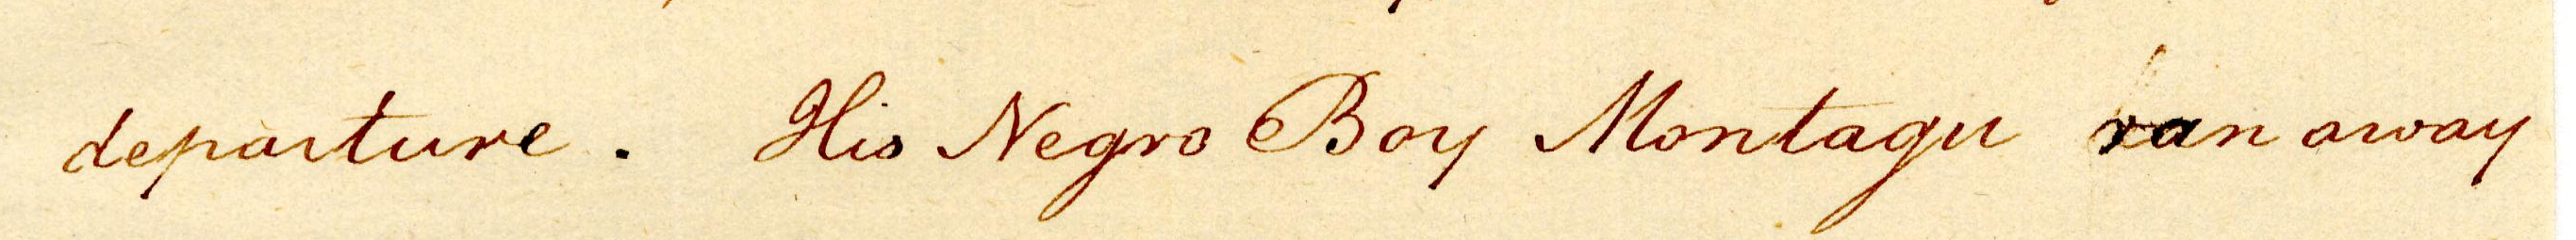departure. His Negro Boy Montagu ran away
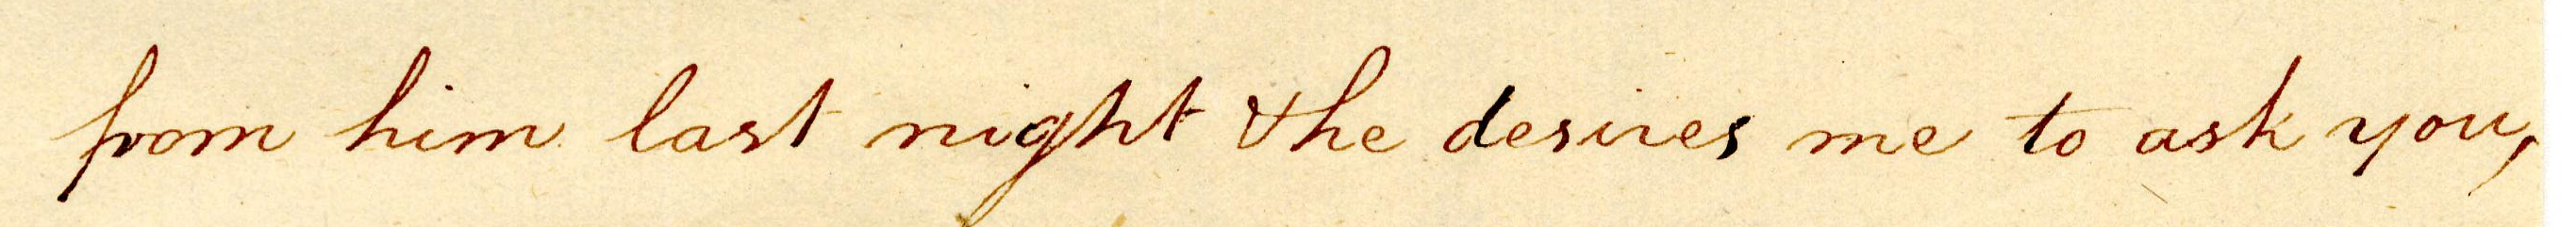from him last night & he desires me to ask you,
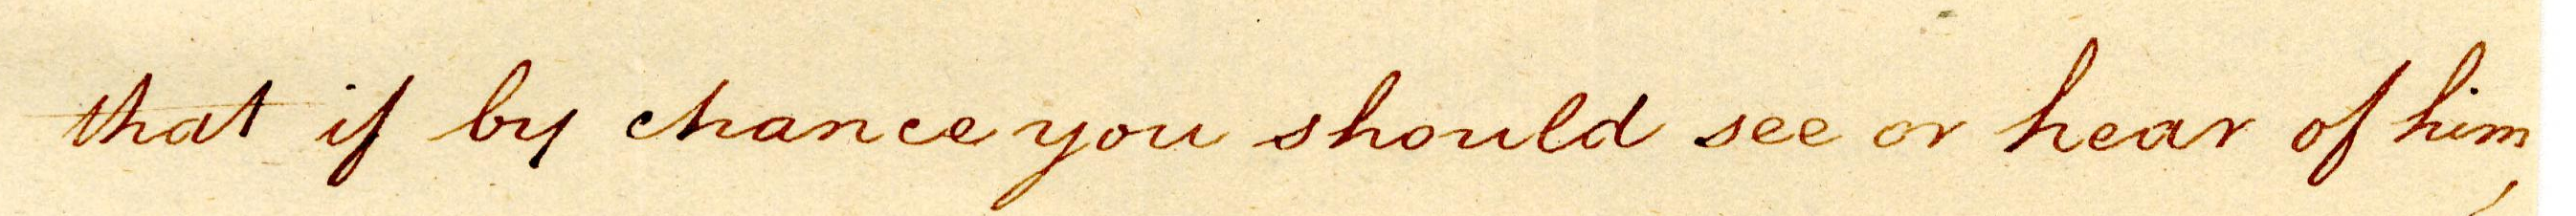that if by chance you should see or hear of him,
